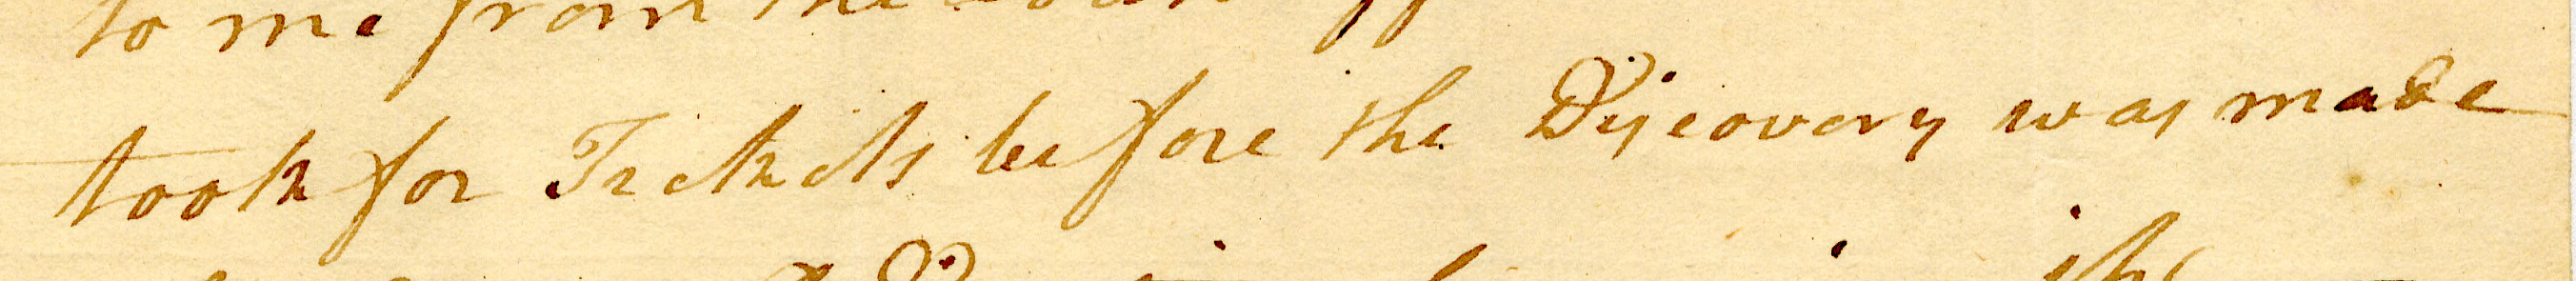took for Tickets before the Discovery was made
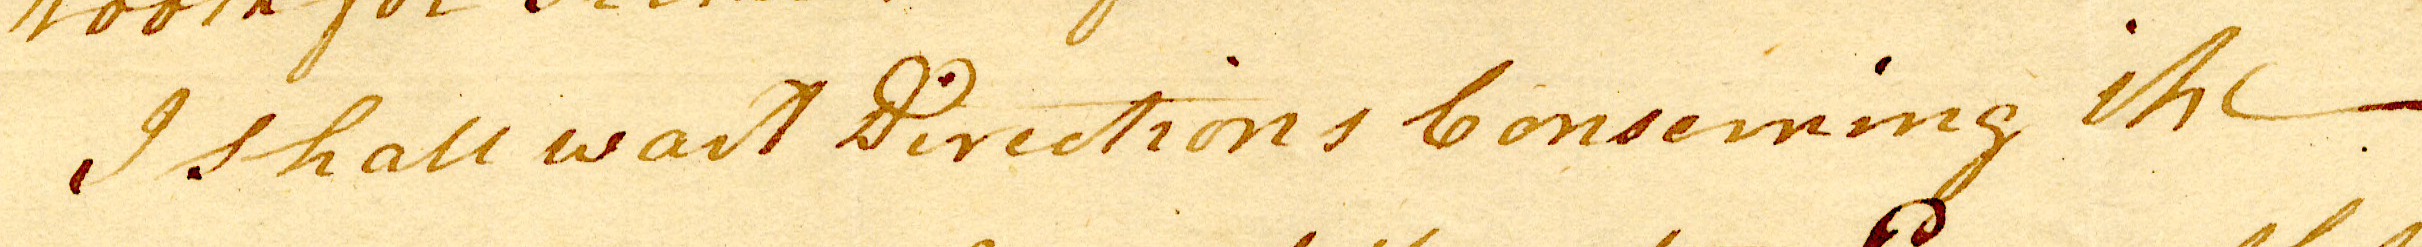I shall want Directions Conserning the
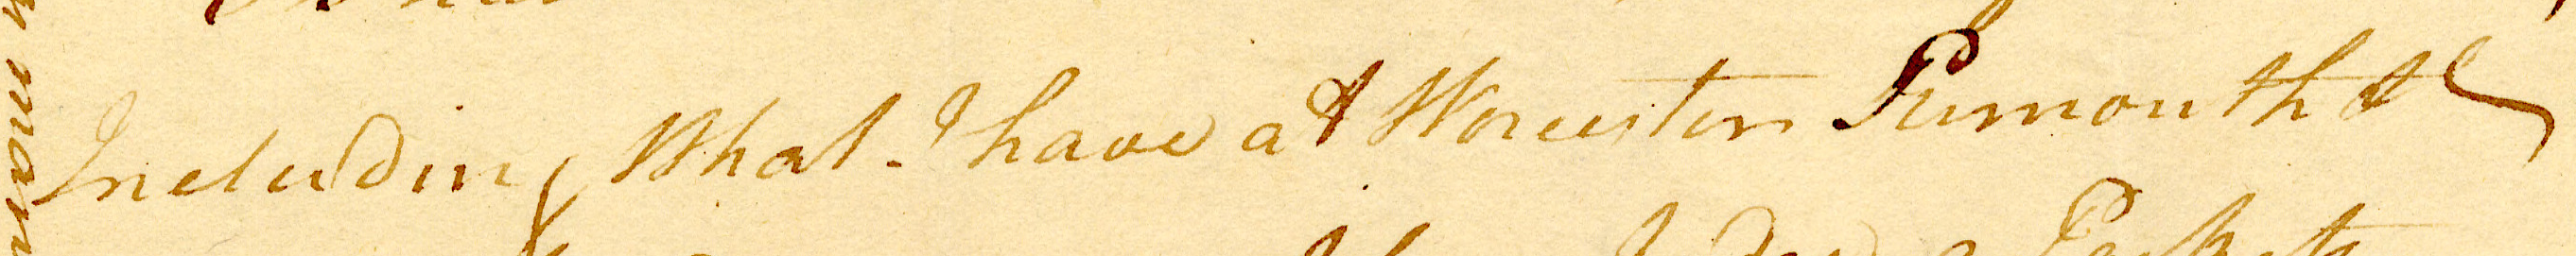Including What I have at Worcestor Sumon th
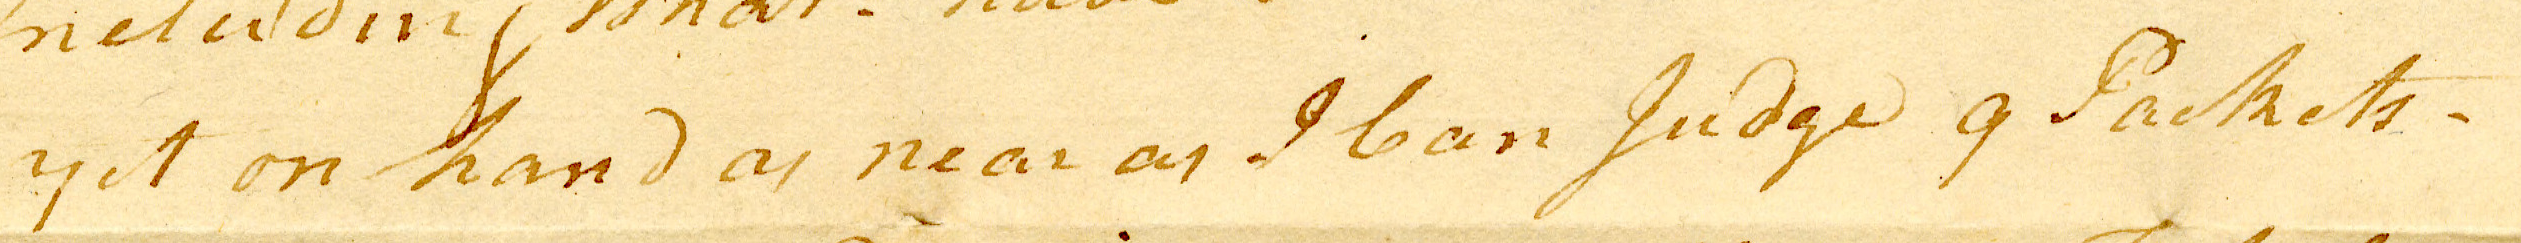yet on hand as near as I Can Judge 9 Packets.
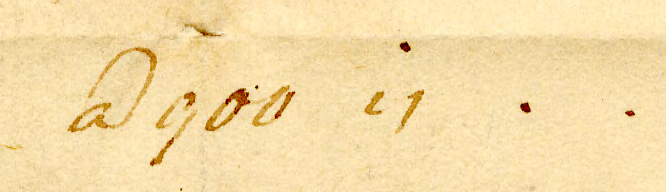a 900 in .
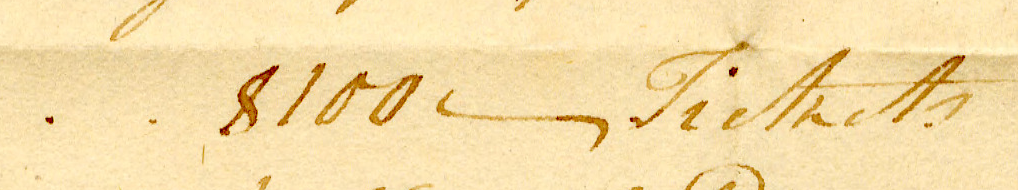.. 8100 - Tickets
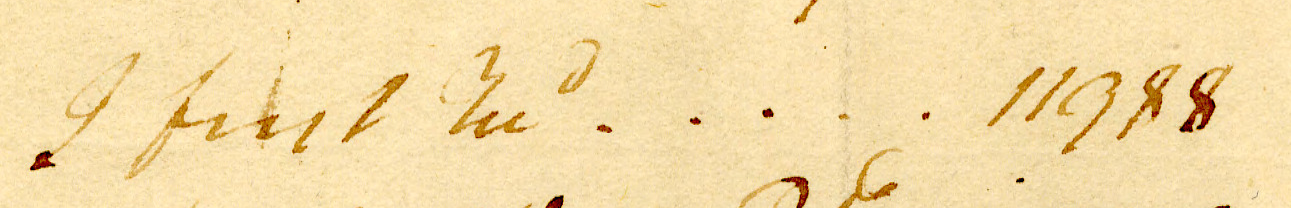I first rec^d ..... 11988
